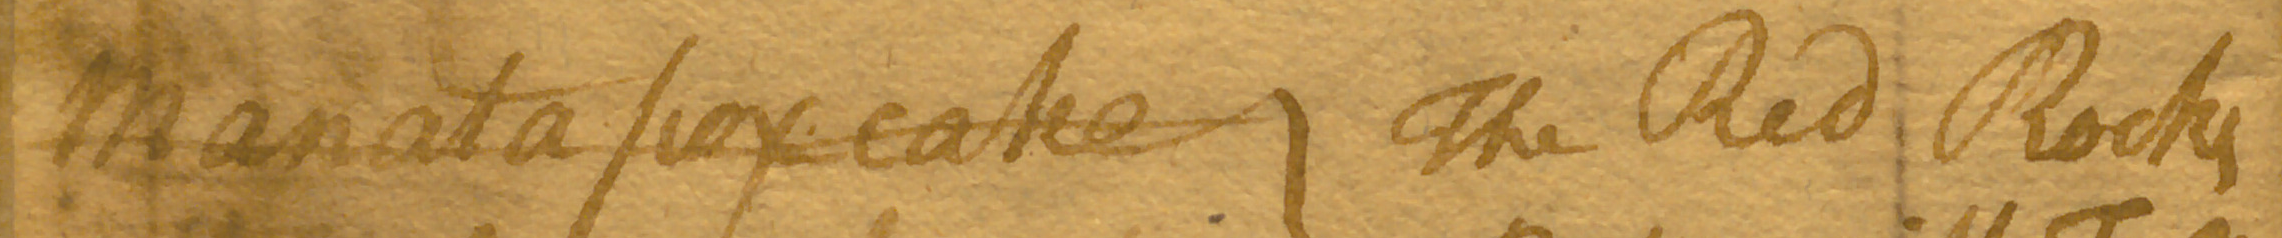Manatasuxcake The Red Rocks
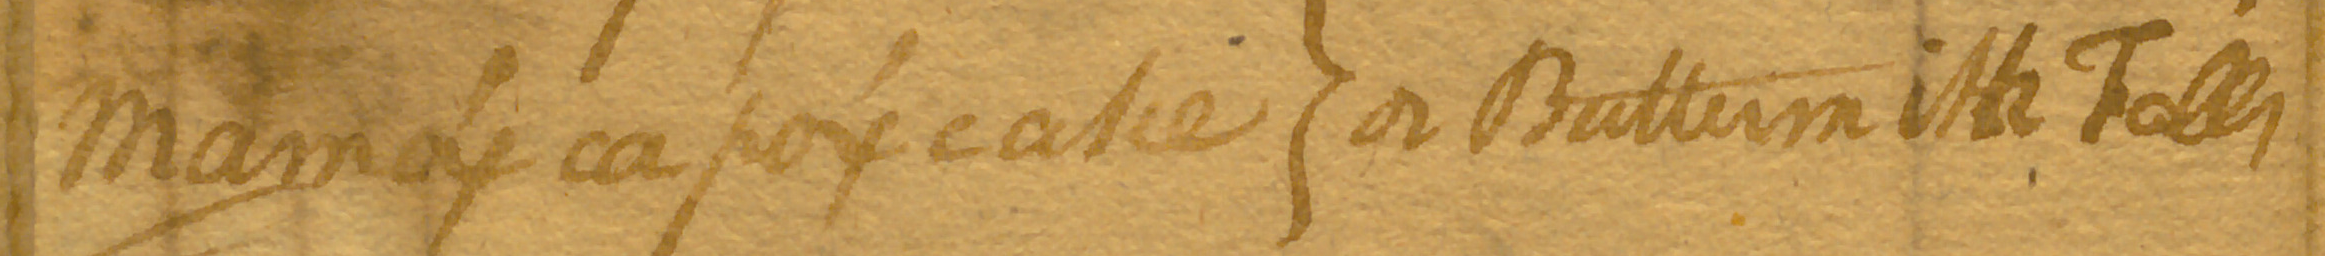mamáxcapóxcake
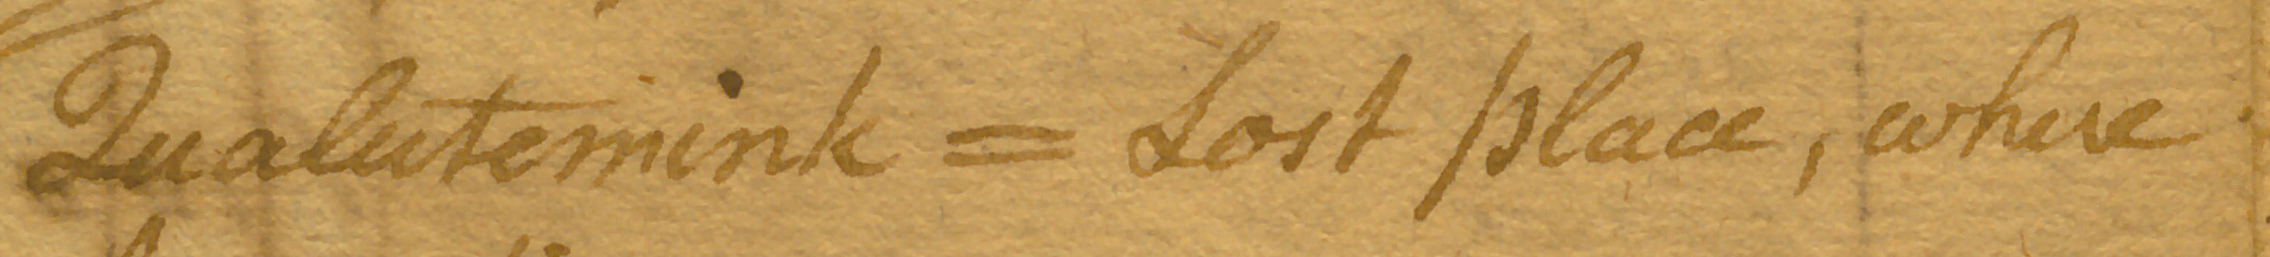Qualutemink = Lost place, where
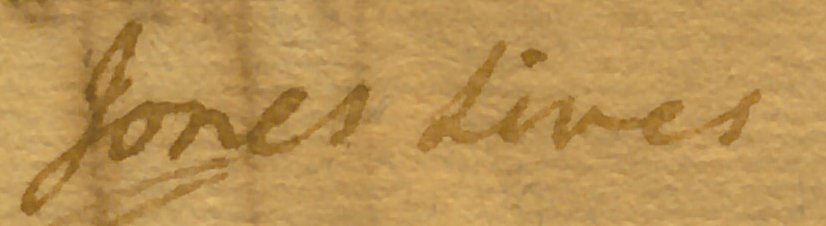Jones Lives
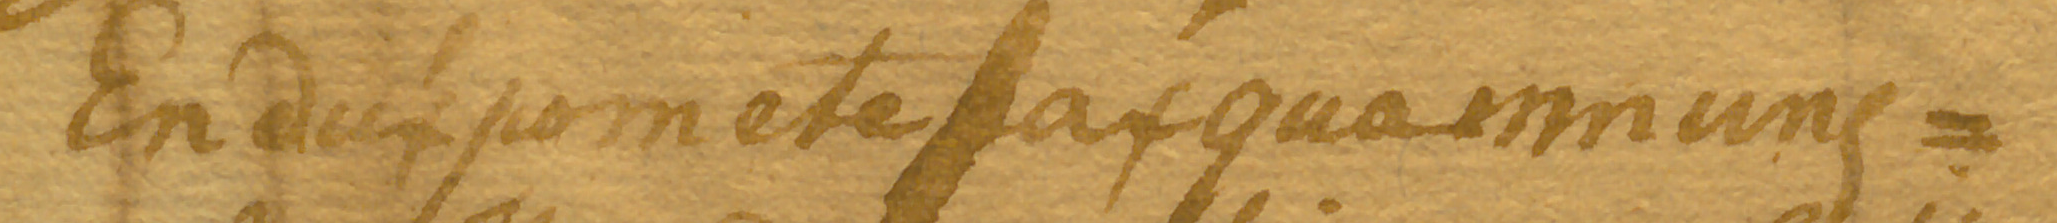Enduxpomete axquarmung =
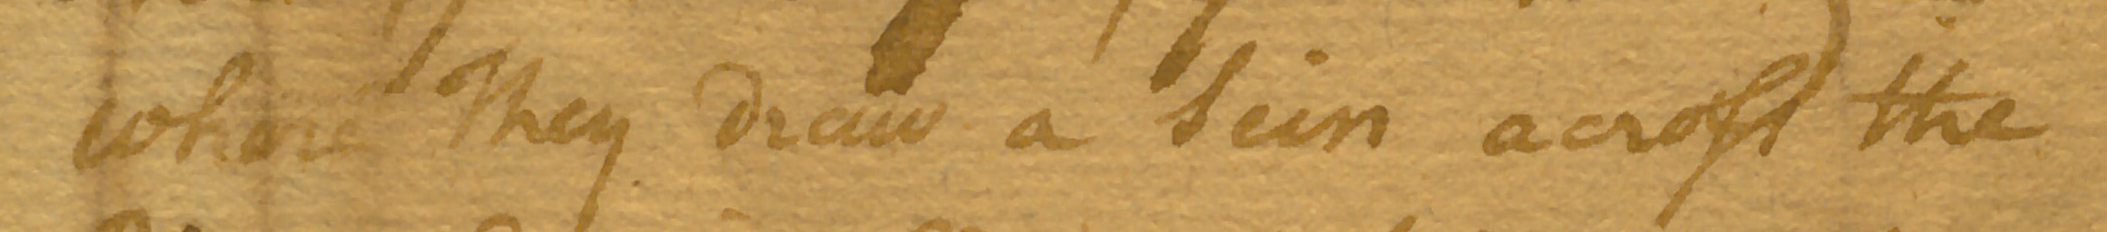where They draw a Lein across the
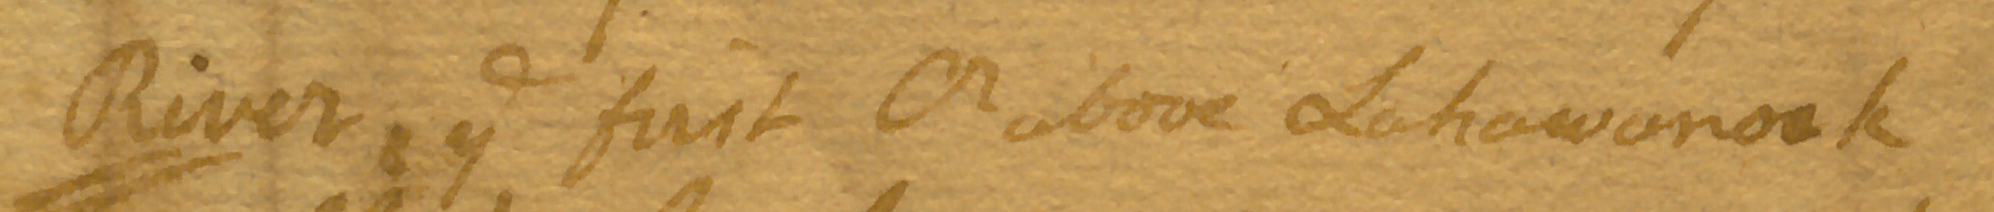River, y^e first C^r above Lahawanock
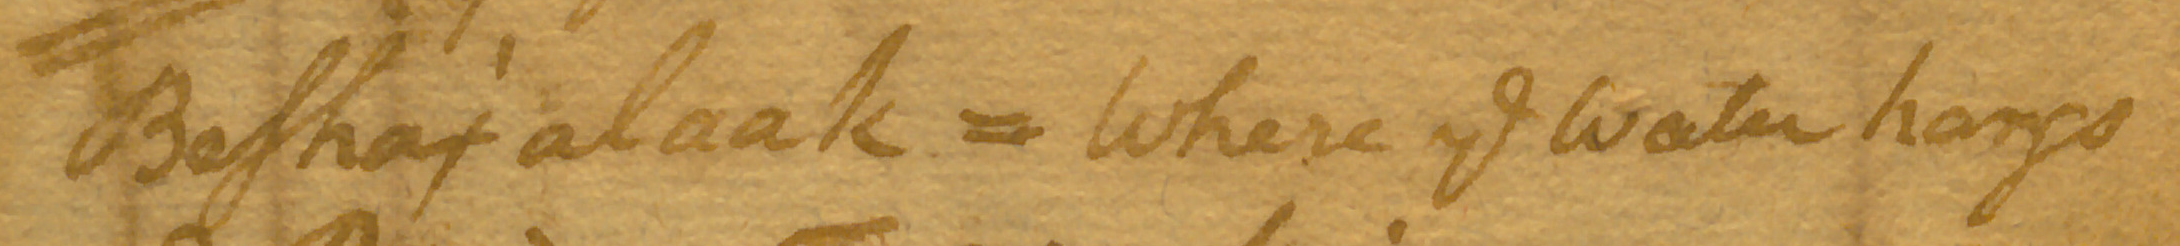Beshaxalaak = where y^e water hangs
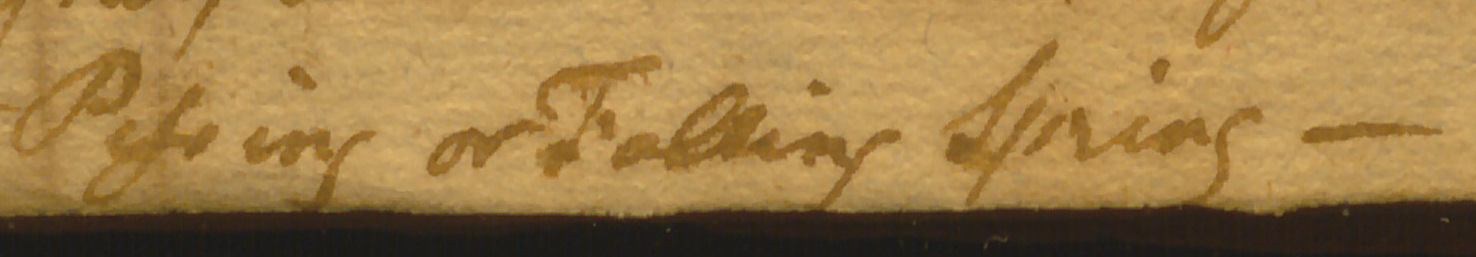Passing or Falling Spring-
